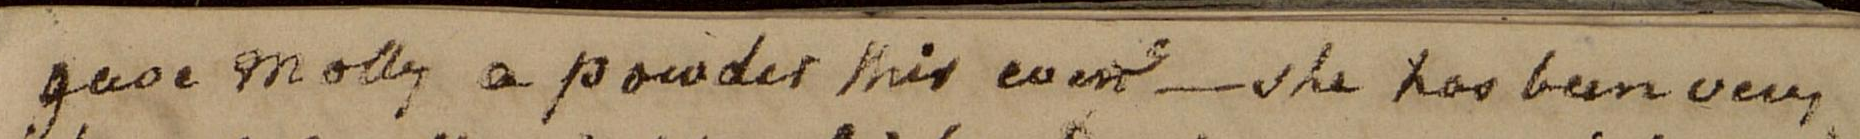gave Molly a powder this even^g.- she has been very
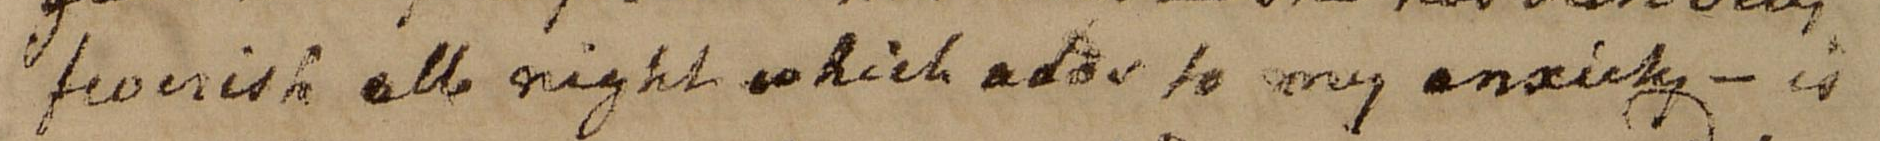feverish all night which adds to my anxiety- is
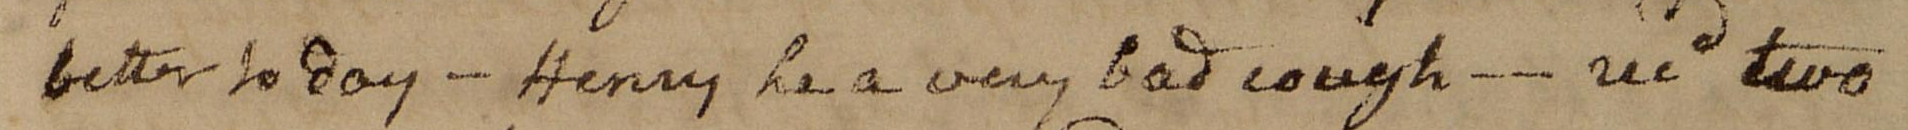better to day- Henry he a very bad cough- rec^d two
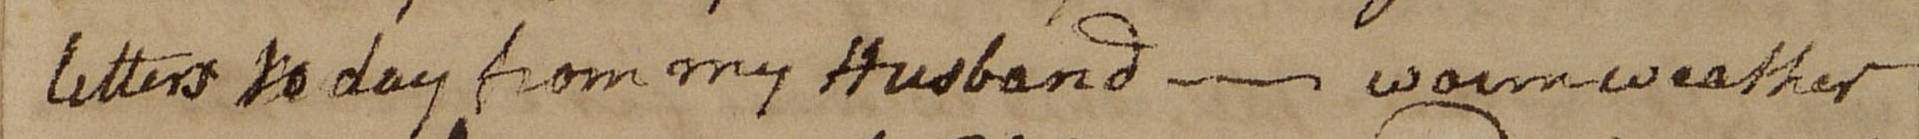letters to day from my Husband- warm weather
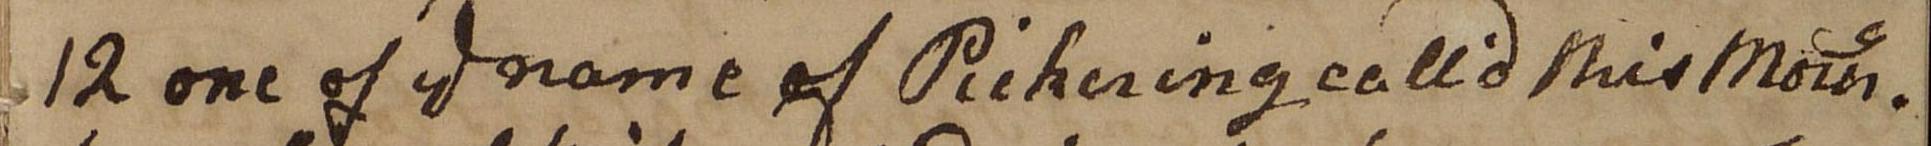12 one of y^e name of Pickering call'd this Morn^g.
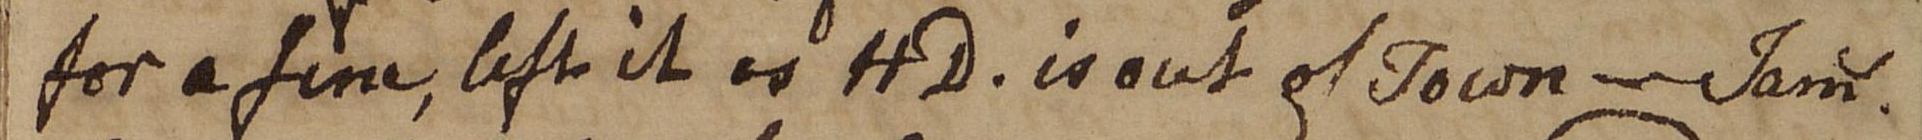for a fine, left it as HD. is out of Town- Jam^s.
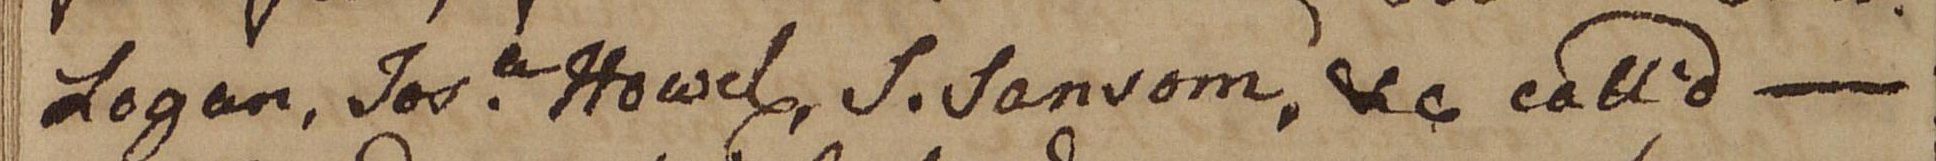Logan, Jos^a. Howel, S. Sansom , &c call'd-
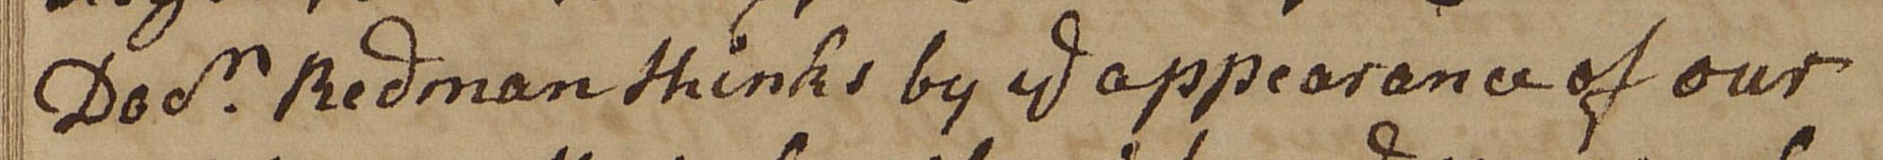Doc^r. Redman thinks by y^e appearance of our
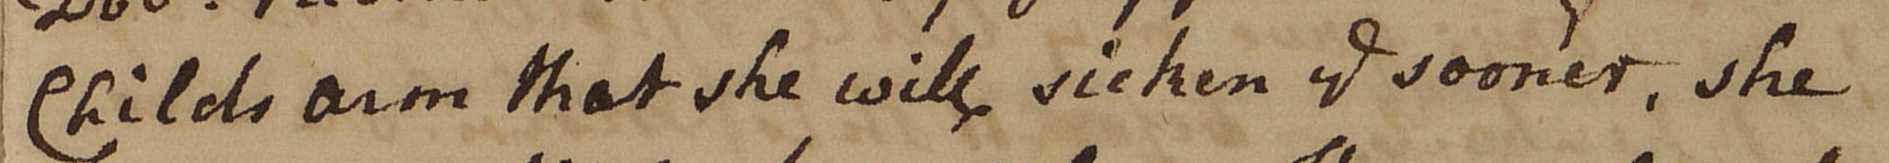Childs arm that she will sicken y^e sooner, she
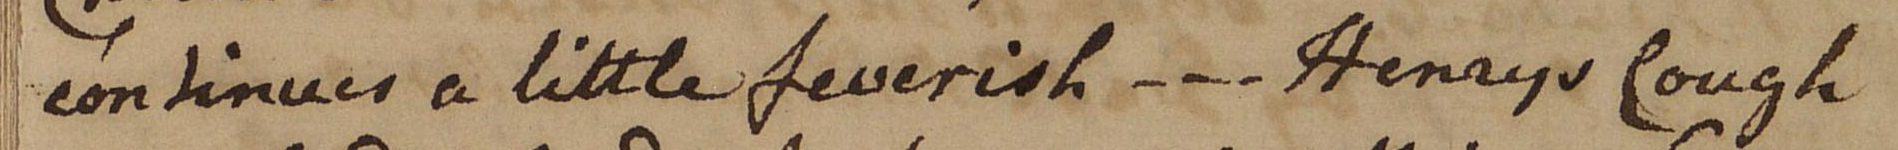continues a little feverish--- Henrys Cough
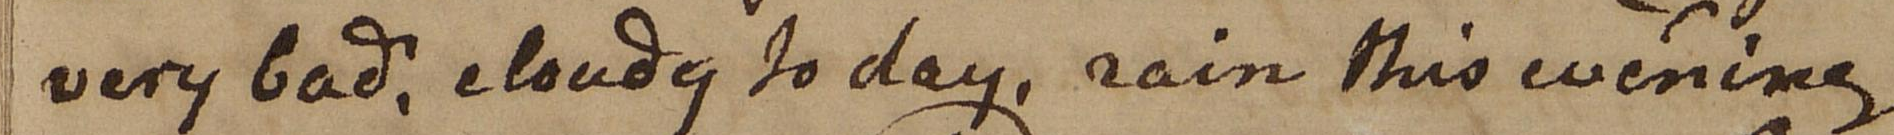very bad, cloudy to day, rain this evening
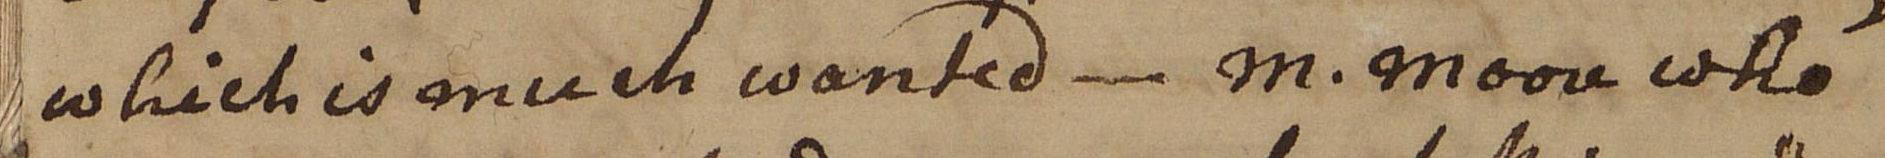which is much wanted- M. Moore who
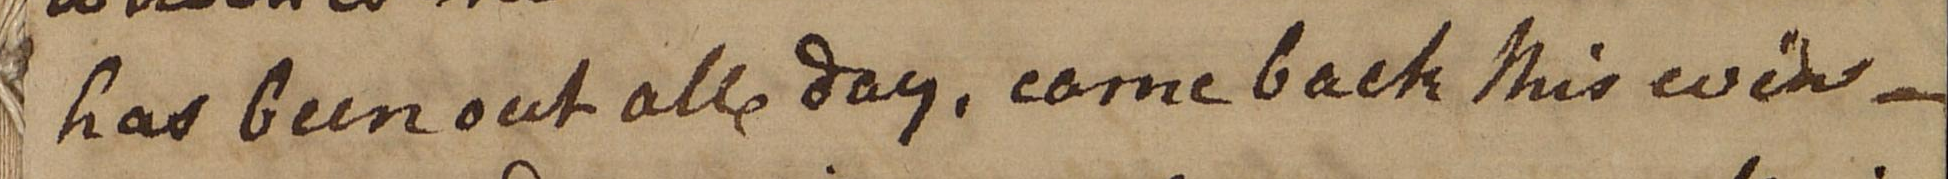has been out all day, came back this even-
